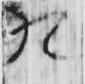九
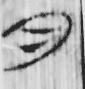月
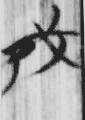戊
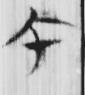午
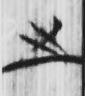之
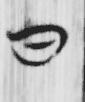日
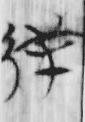○（射）
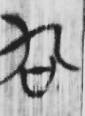叴
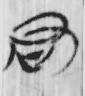君
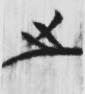之
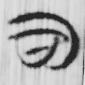司
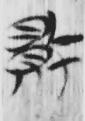敗
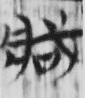戕
